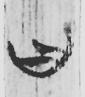曰
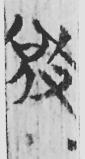敓（說）
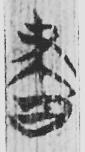晝
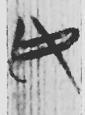女
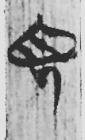見
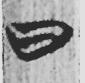日
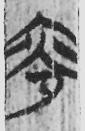夜
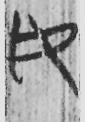女
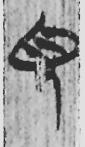見
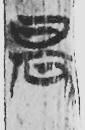晨
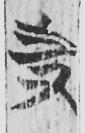寺
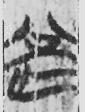罔
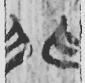非
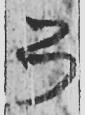乃
